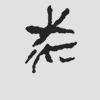蒼
